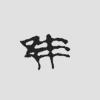隹
